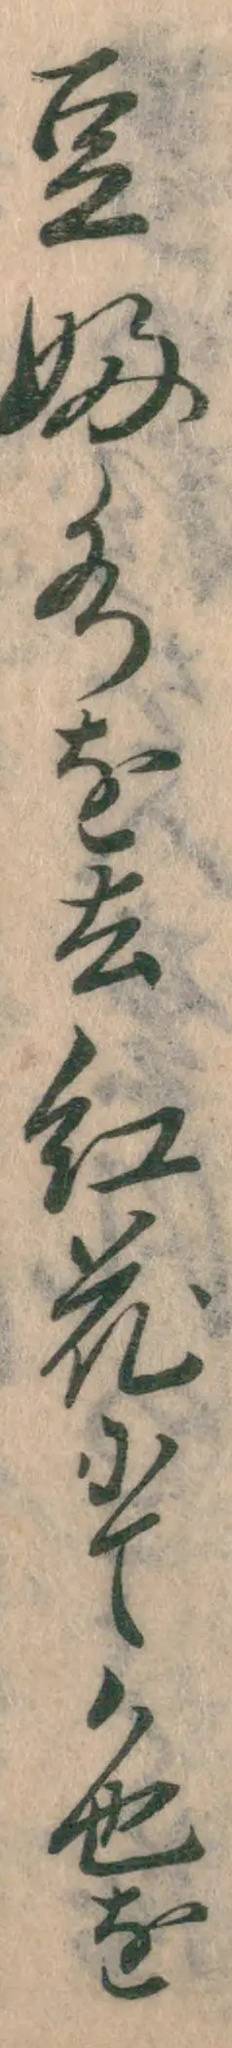豆ふ水を去紅花にて色を
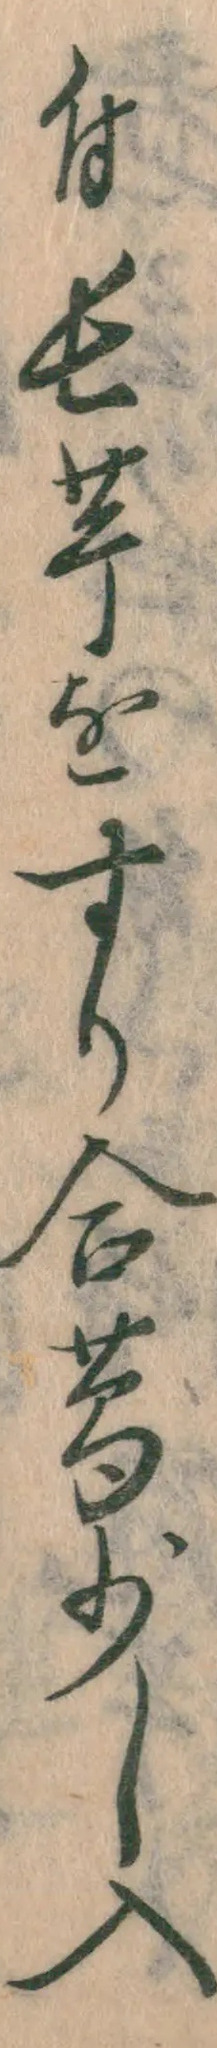付長芋をすり合葛少し入
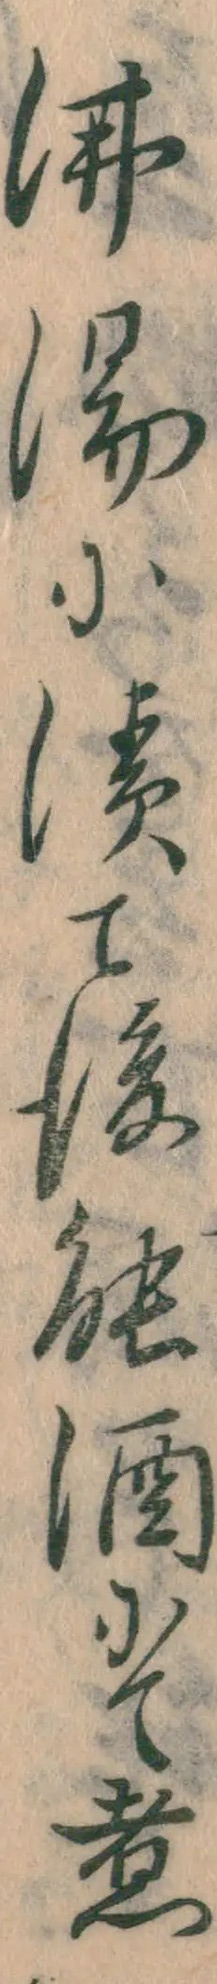沸湯に漬て後能酒にて煮
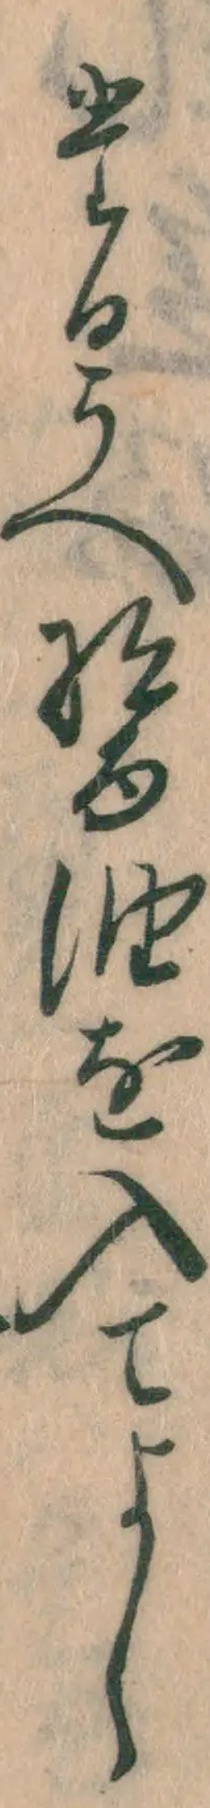たるうへ醤油を入てよし
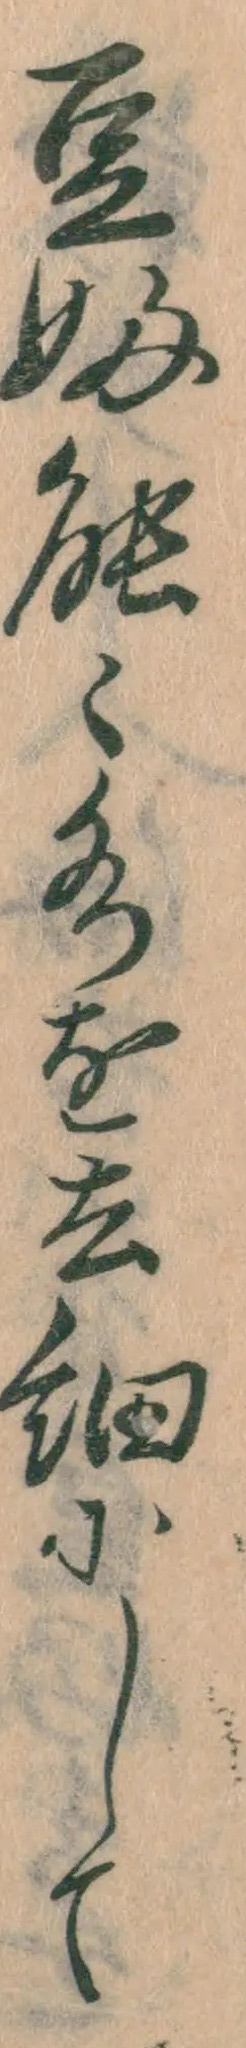豆ふ能く水を去細にして
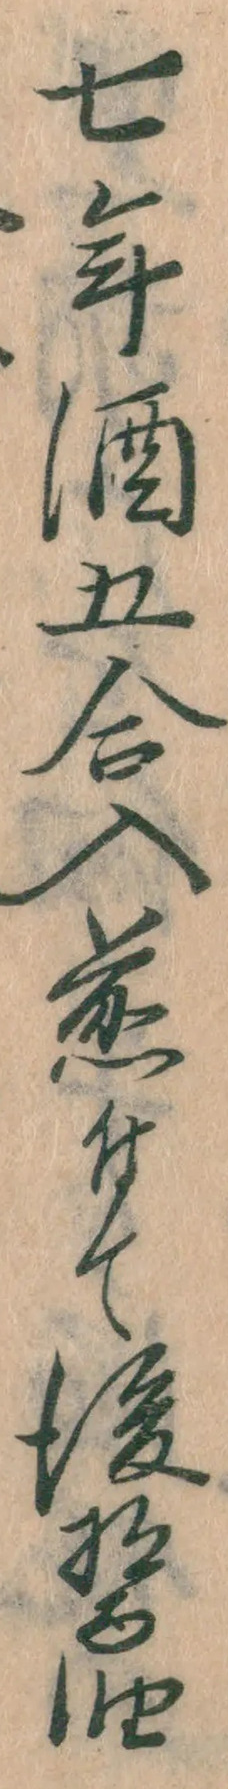七年酒五合入煎付て後醤油
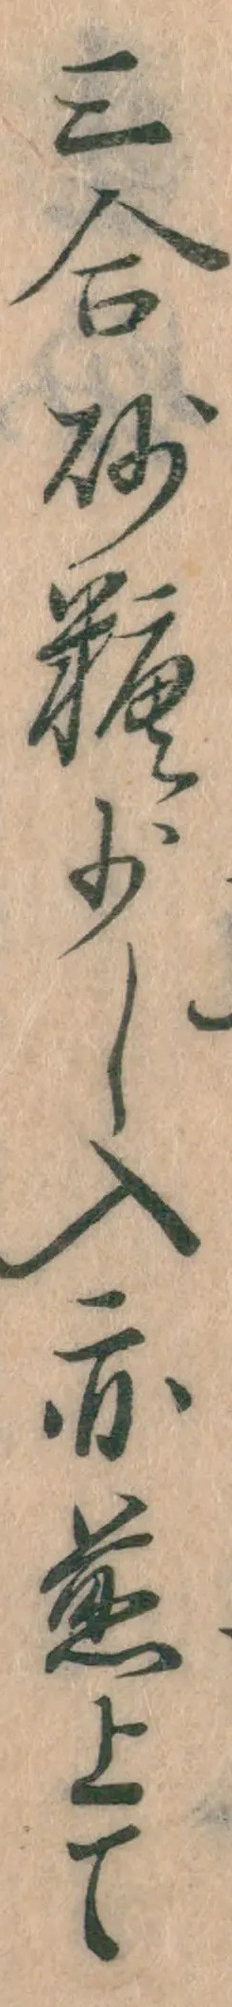三合砂糖少し入亦煎上て
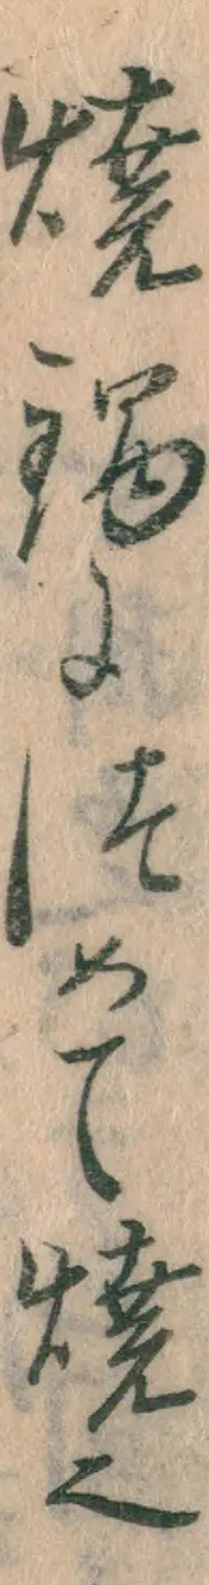焼鍋につめて焼也
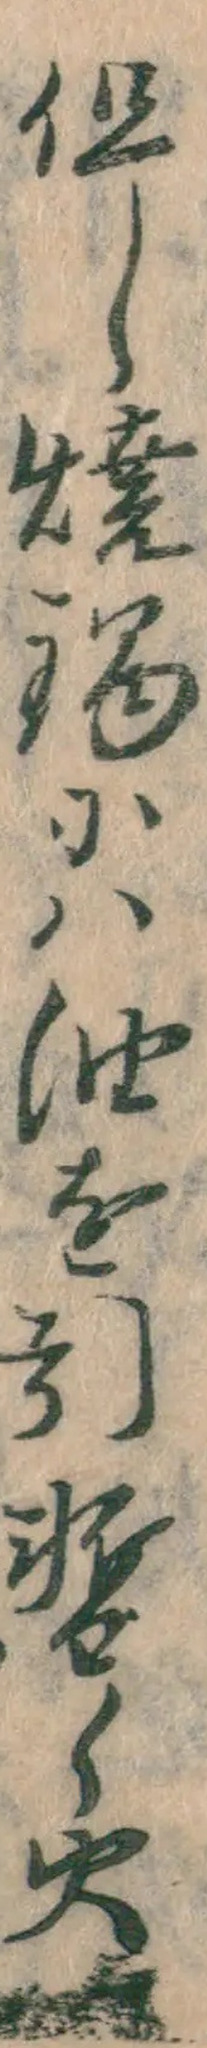但し焼鍋には油を引暫く火
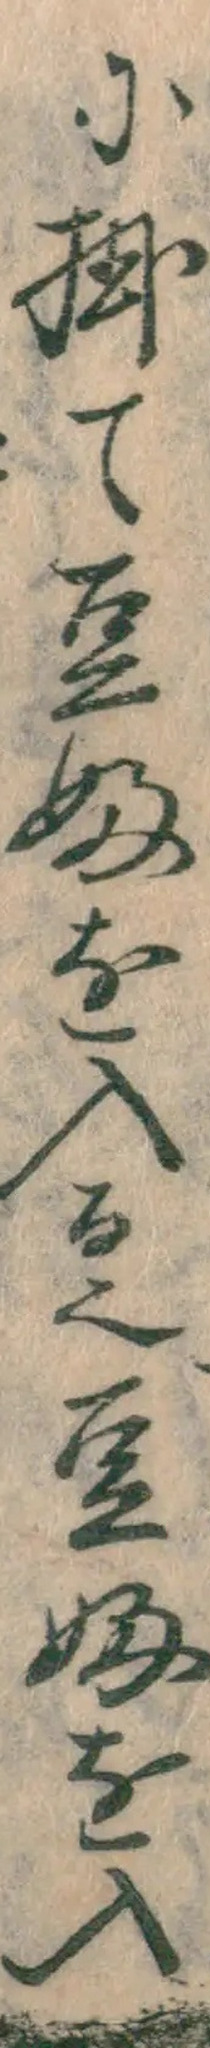に掛て豆ふを入る也豆ふを入
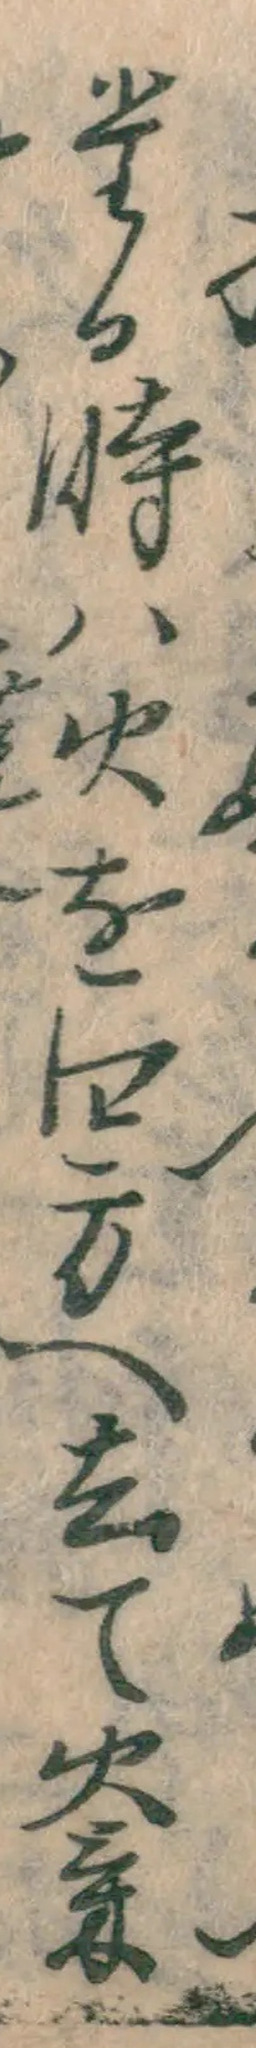たる時は火を四方へ去て火気
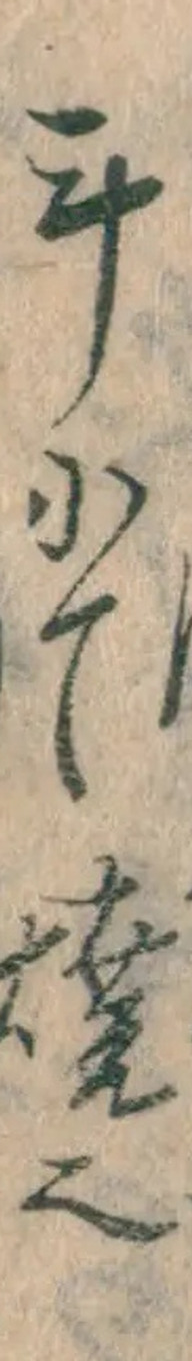計にて焼也
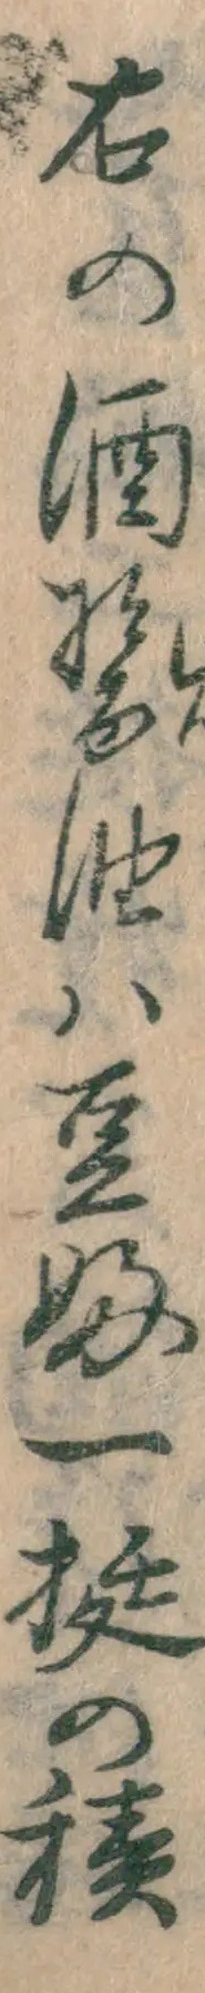右の酒醤油は豆ふ一挺の積

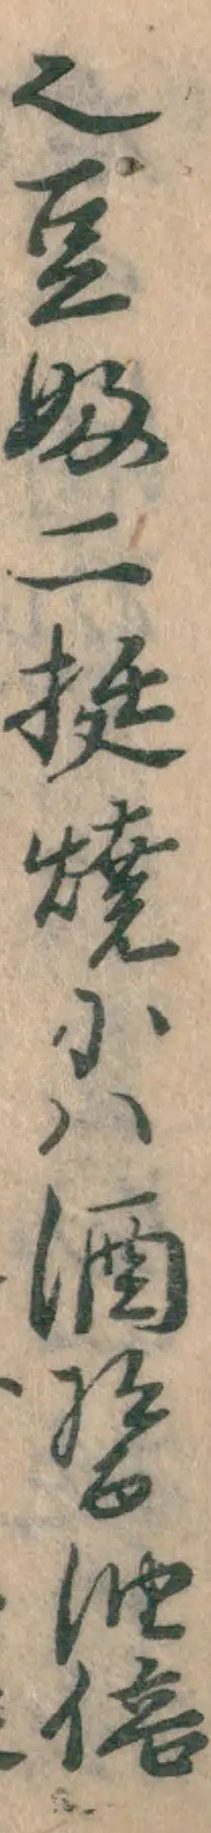也豆ふ二挺焼には酒醤油倍
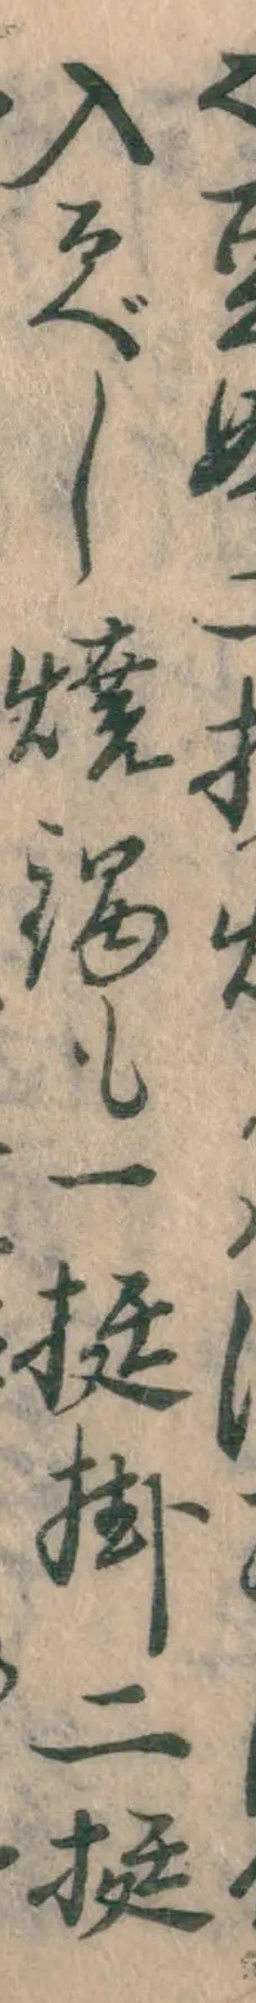入るべし焼鍋も一挺掛二挺
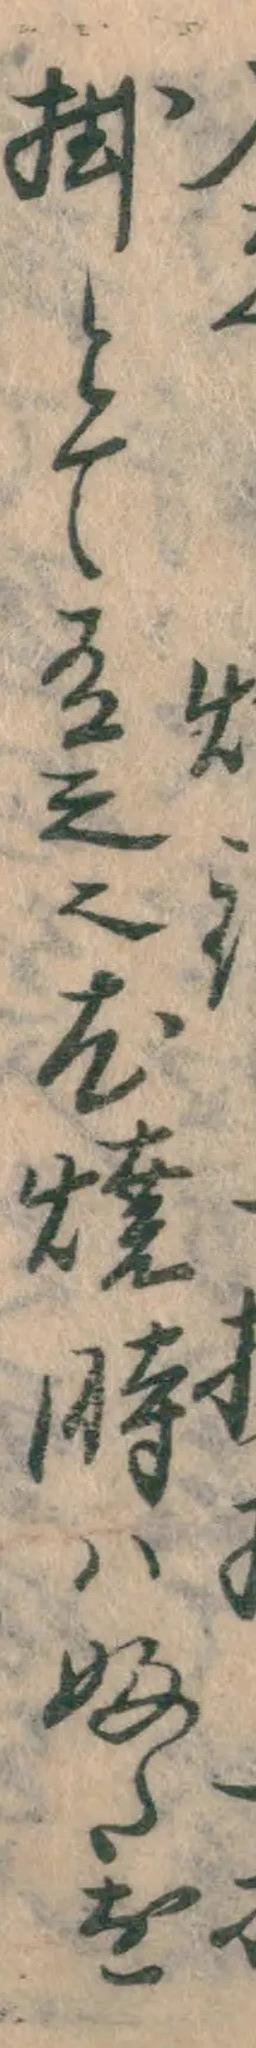掛とて有之也尤焼時はふたを
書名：豆腐百珍余録
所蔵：国立国会図書館 National Diet Library, JAPAN
